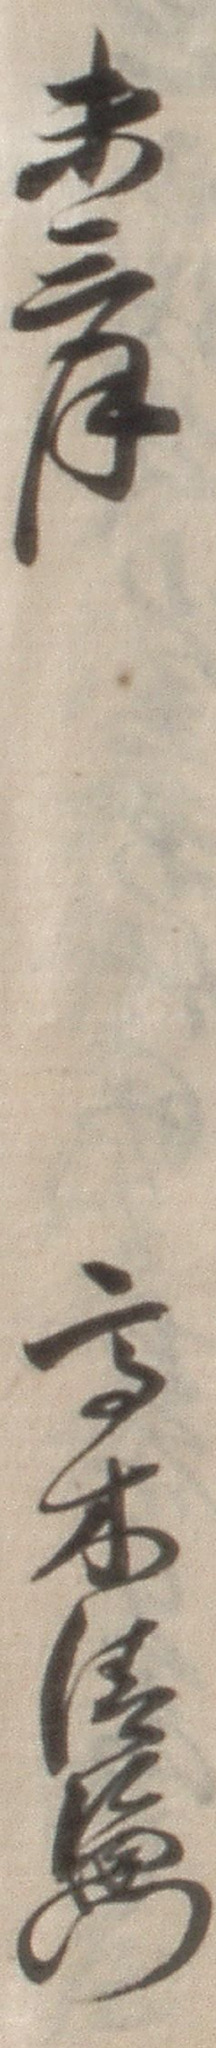未三月高木清左衛門
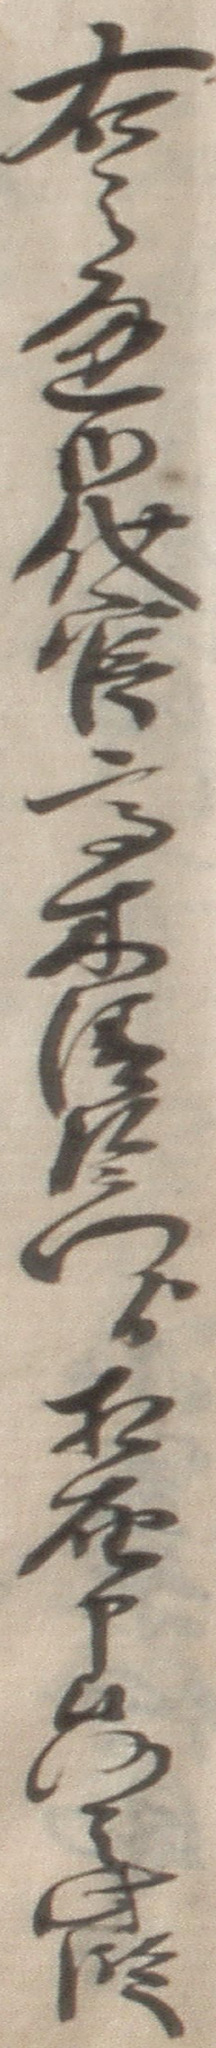右之通御代官高木清左衛門ゟ相届申候仍之此段
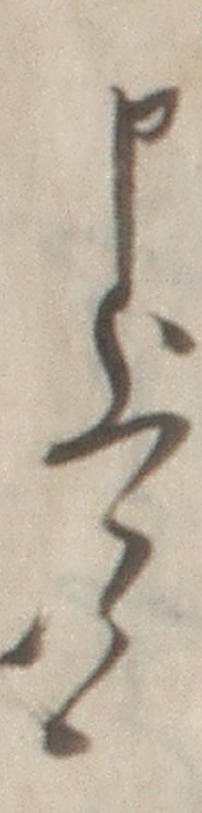申上候以上
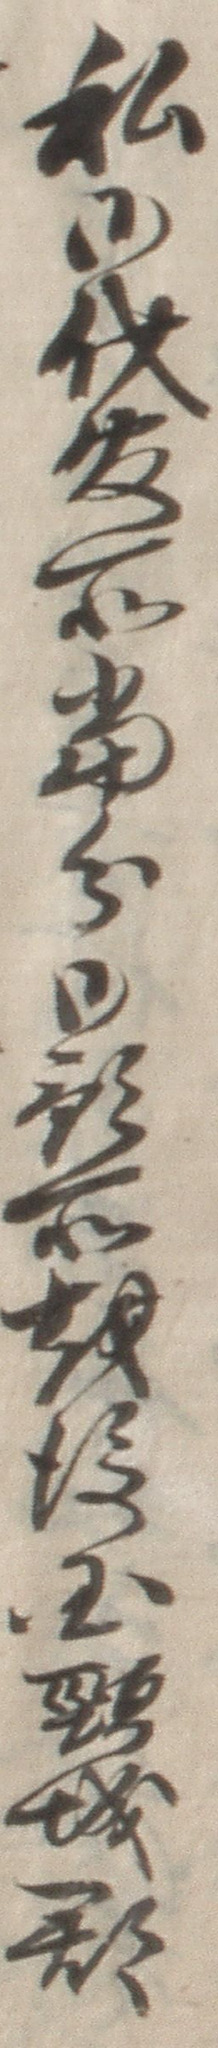私御代官所当分御預所越後国頸城郡
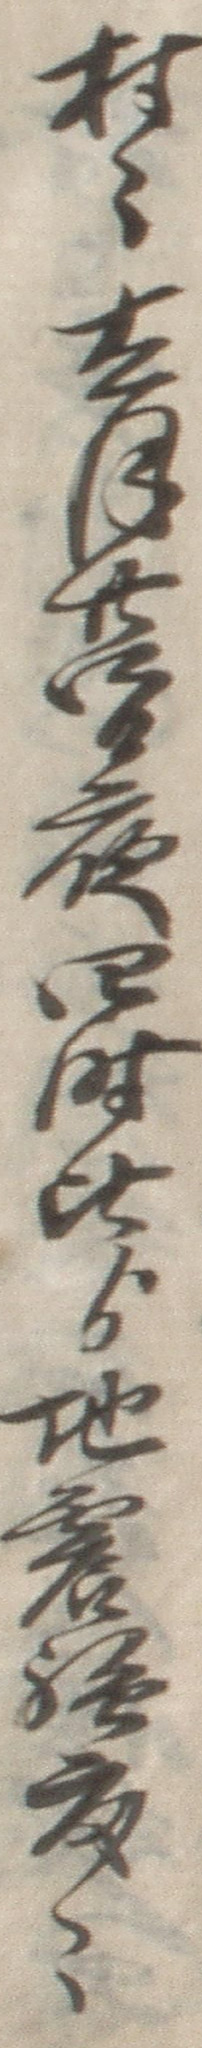村々去月廿四日夜四時比ゟ地震強度々
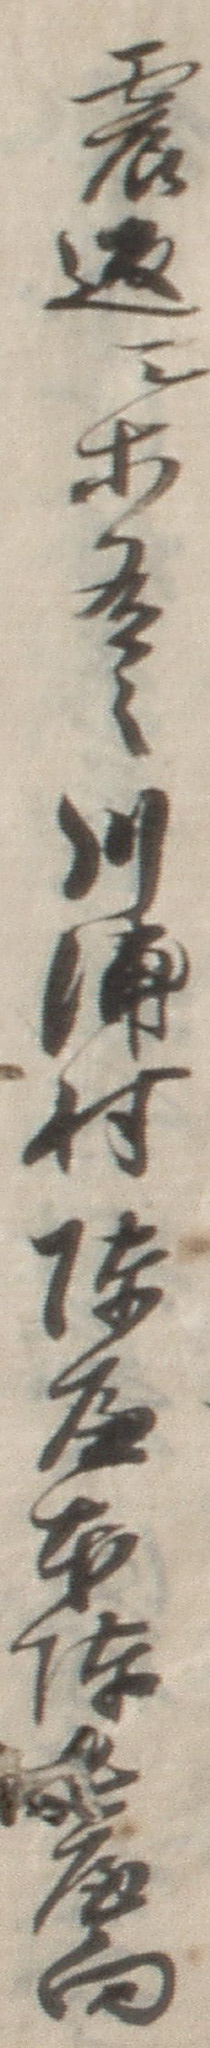震返ㇱ等有之川浦村陣屋本陣長屋向

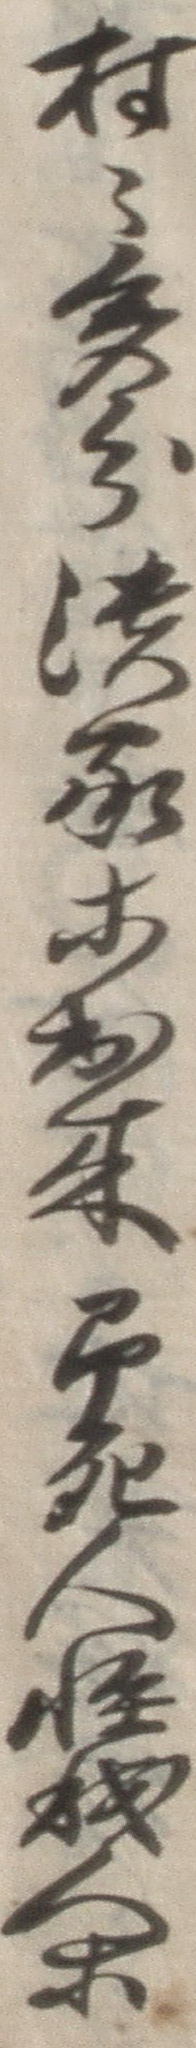村々多分潰家等出来即死人怪我人等
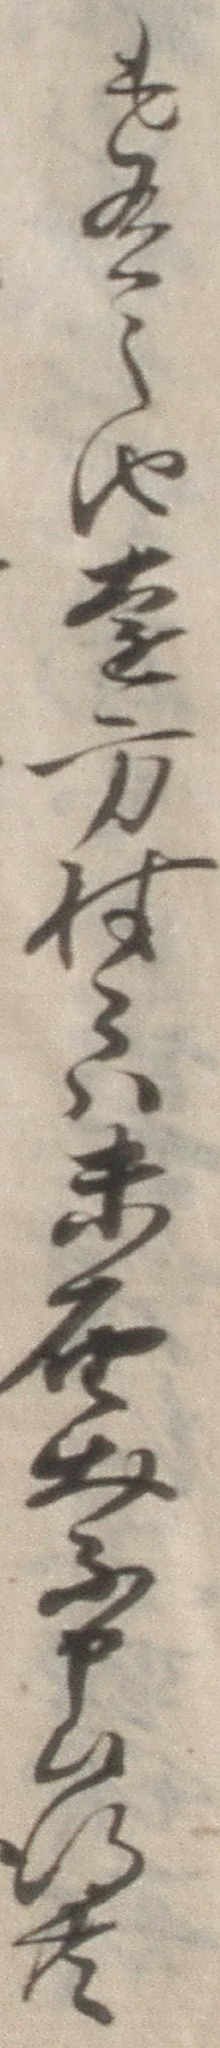も有之由遠方村々ハ未届出不申候得共
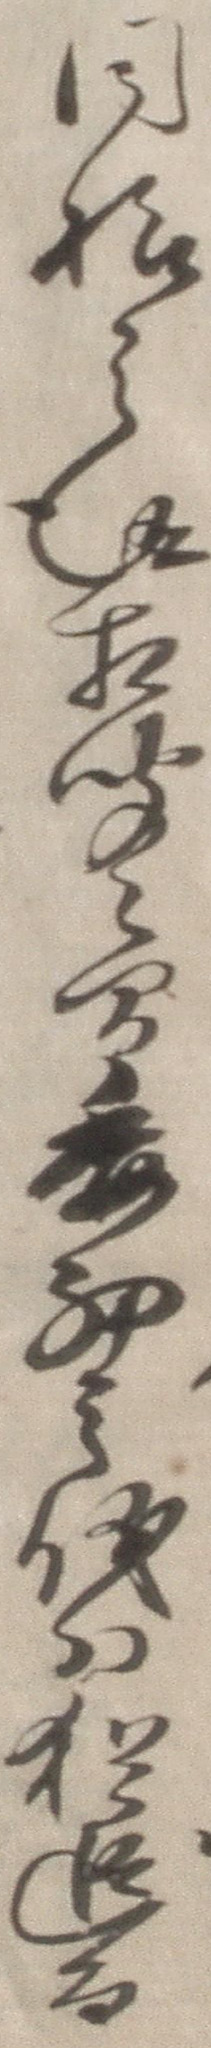同様之趣相聞候間委細之儀ハ猶追而
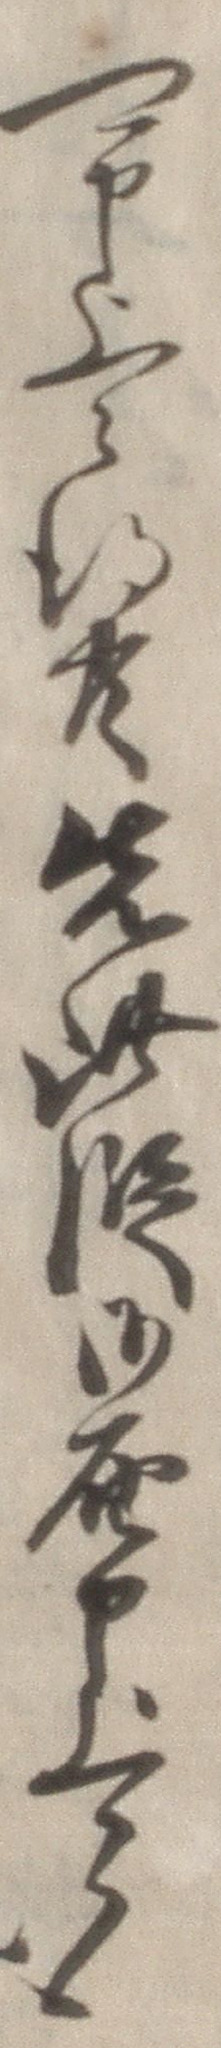可申上候得共先此段御届申上候以上
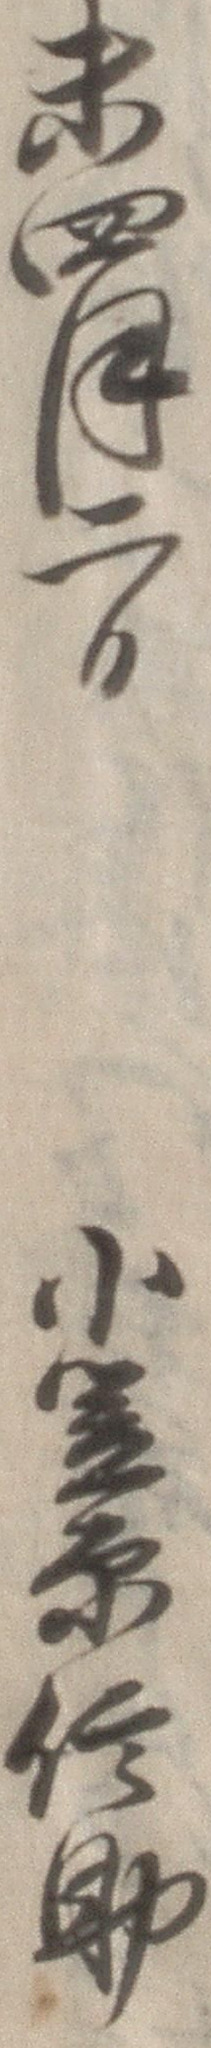未四月二日小笠原信助
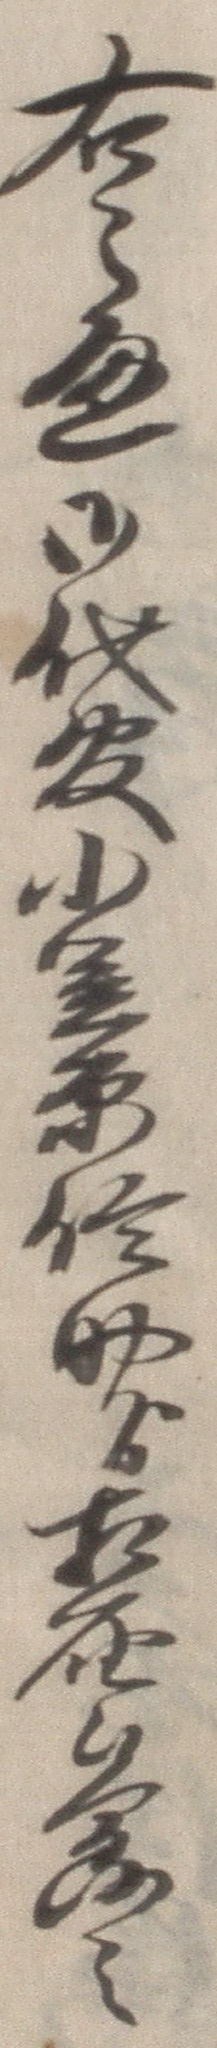右之通御代官小笠原信助ゟ相届候写仍之
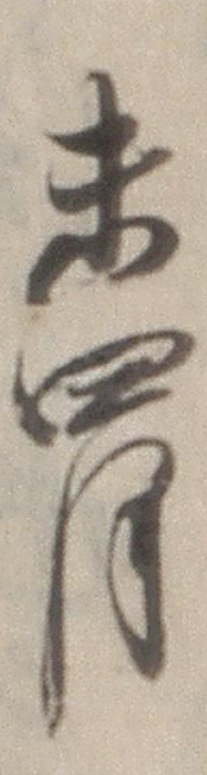未四月
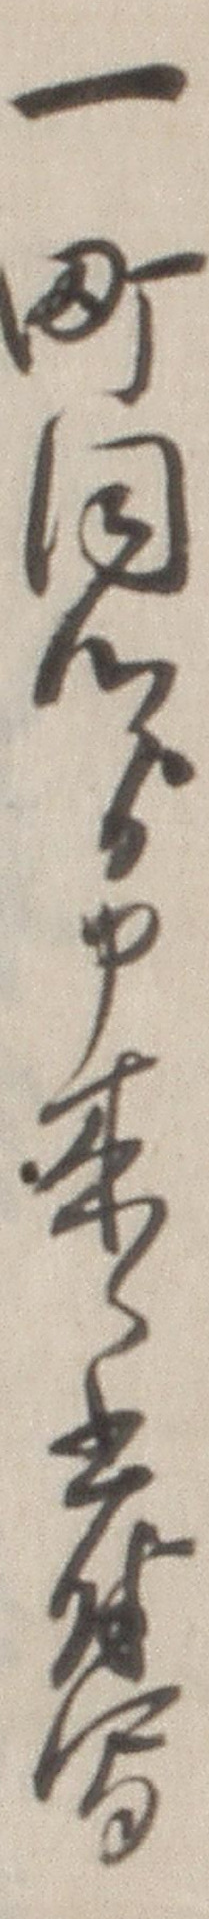一町同心ゟ申来候書付写
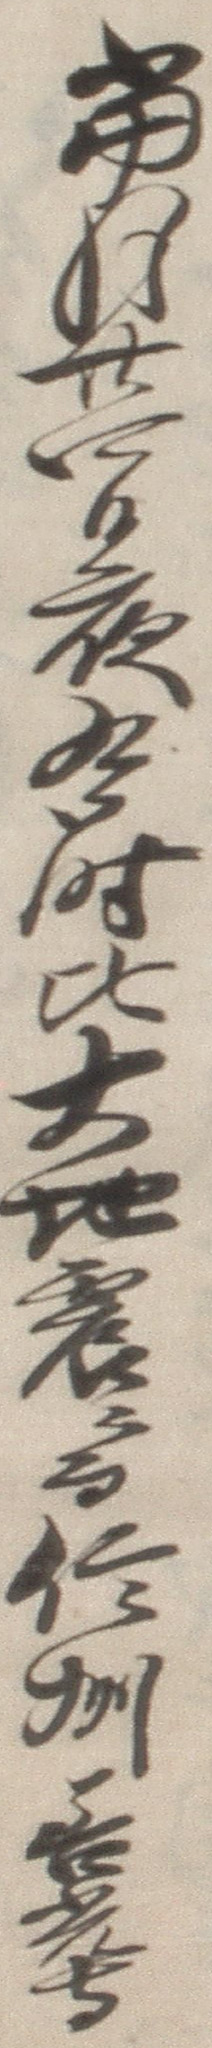当月廿四日夜九ッ時比大地震二而信州善光寺
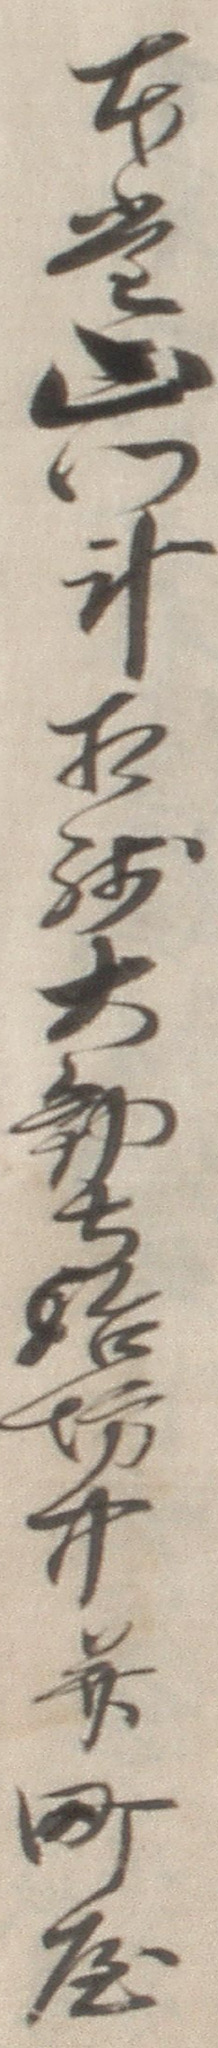本堂山門計相残大勧寺始坊中并町屋
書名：信州地震一件
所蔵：東京大学地震研究所図書室 Earthquake Research Institute Library, The University of Tokyo, JAPAN
